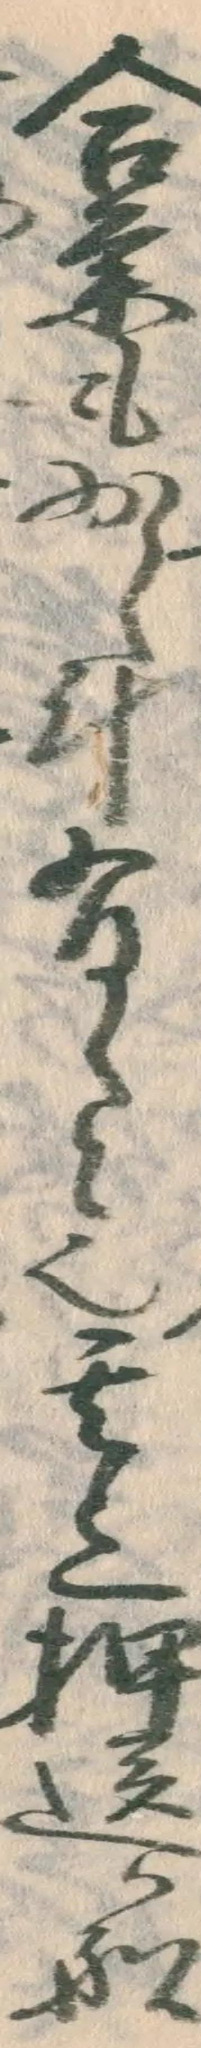合薬も少し斗有しと也其上押送り船
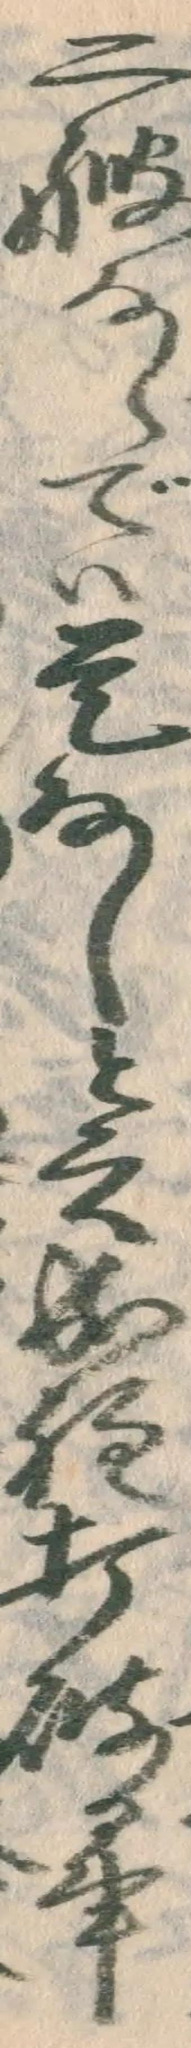ニ艘ならでハ是なしと云成程打破る事
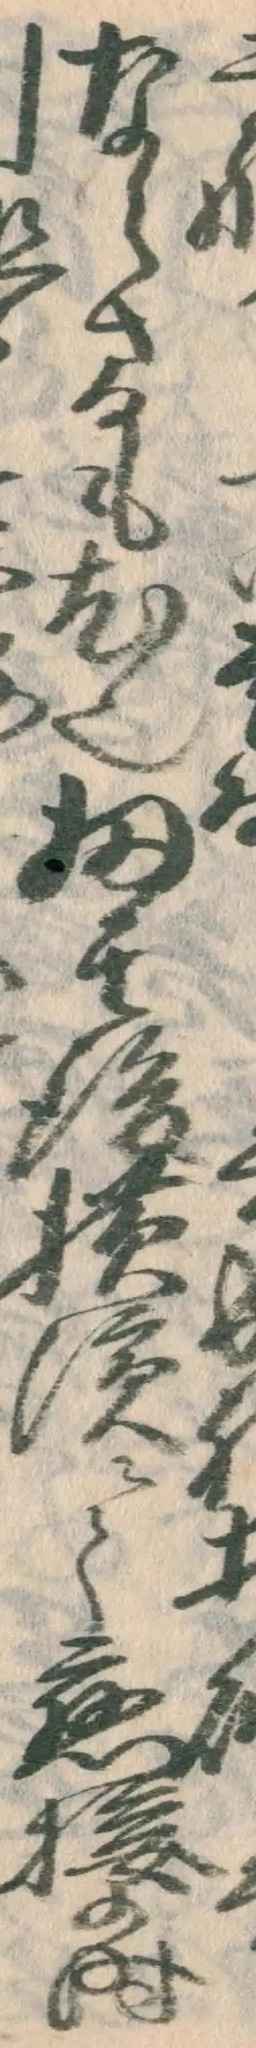ならさるも尤也扠其後横濱ニて應接の時
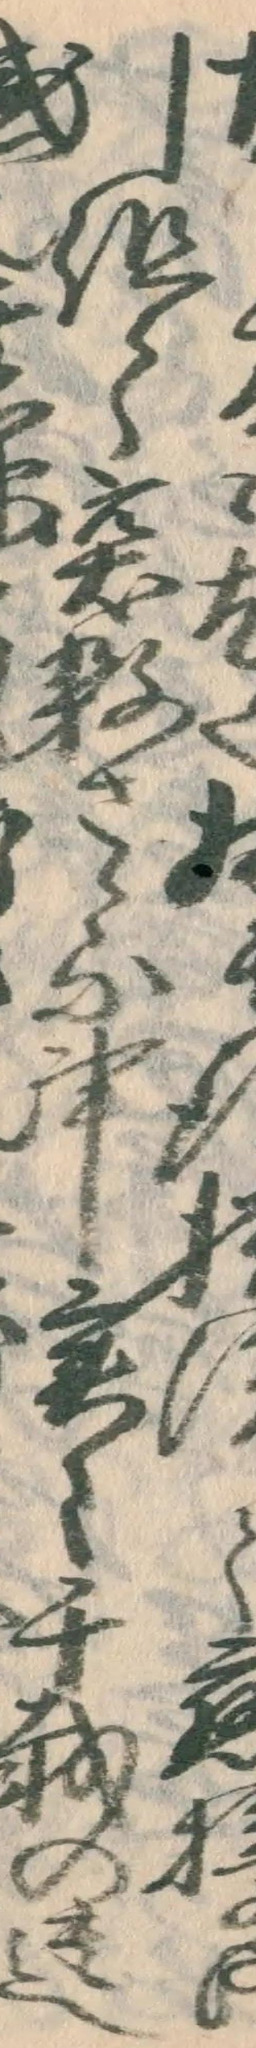し組て突殺さゝる事実に千載の遺
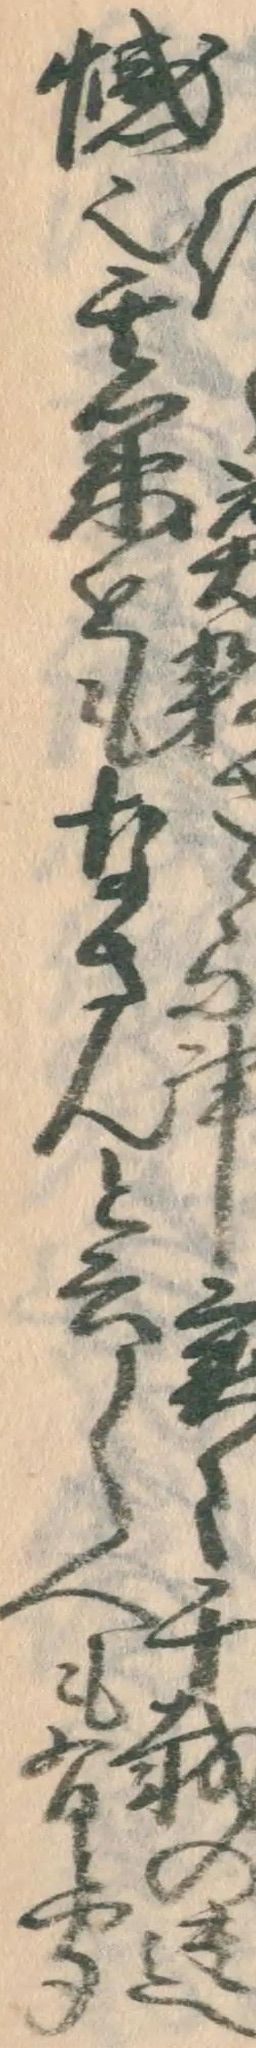憾也其策をもなさんと云し人も有と聞

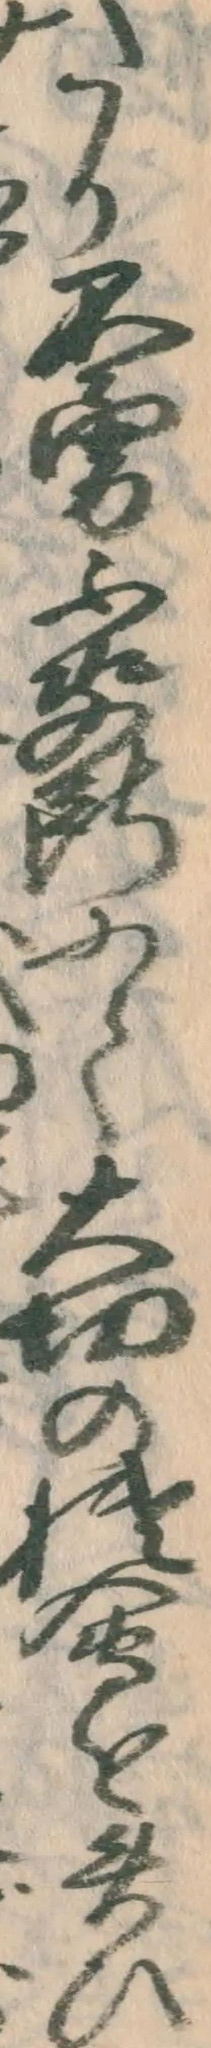たり不勇不決断にて大切の機會を失ひ
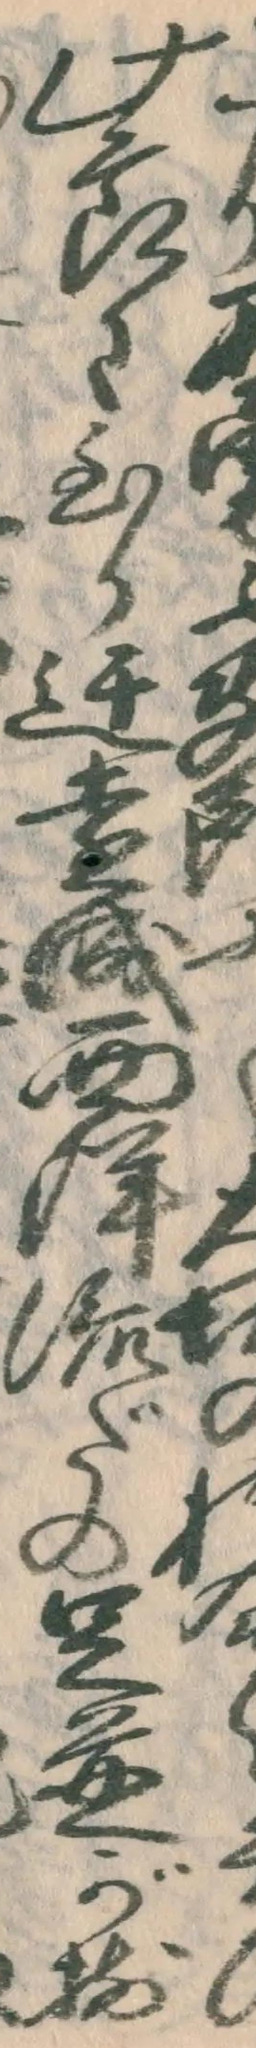此節に至り迂遠成西洋流だの足並が揃
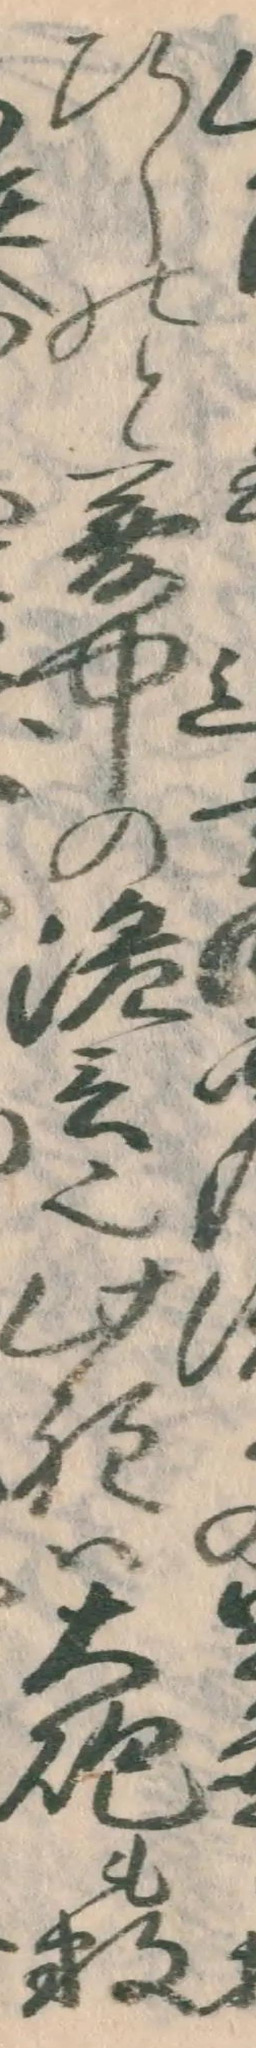ひしのと夢中の詭言也此程ハ大砲も数
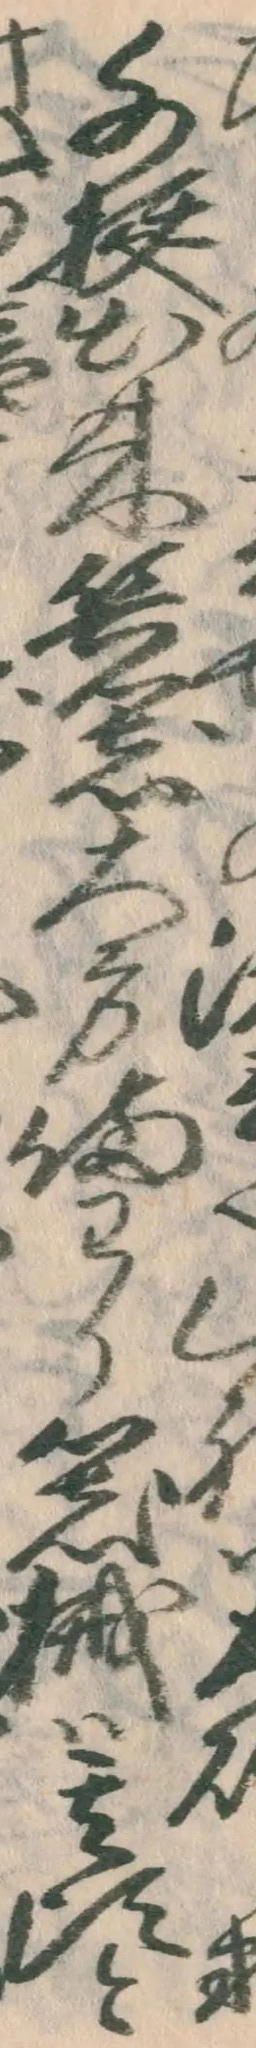千挺出来兵器大方備わり器械ハ其頃と
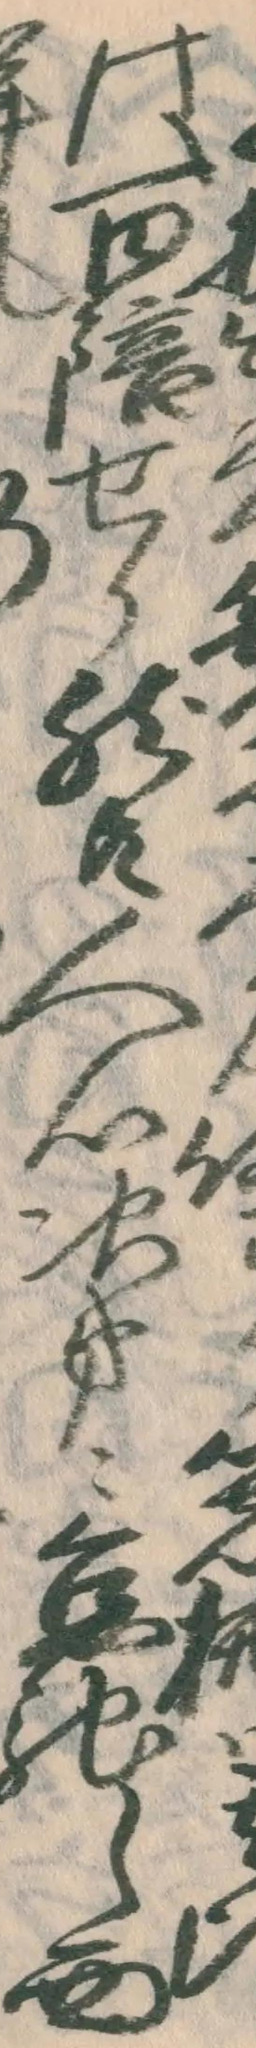は百陪せり然共人心次第ニ怠弛し西
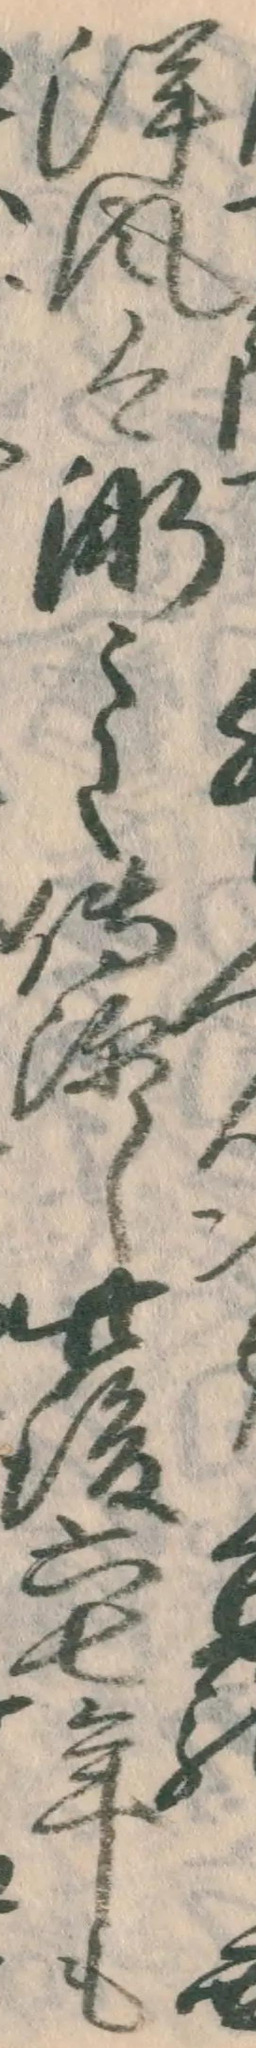洋風は漸々に傳深し此後六七年も
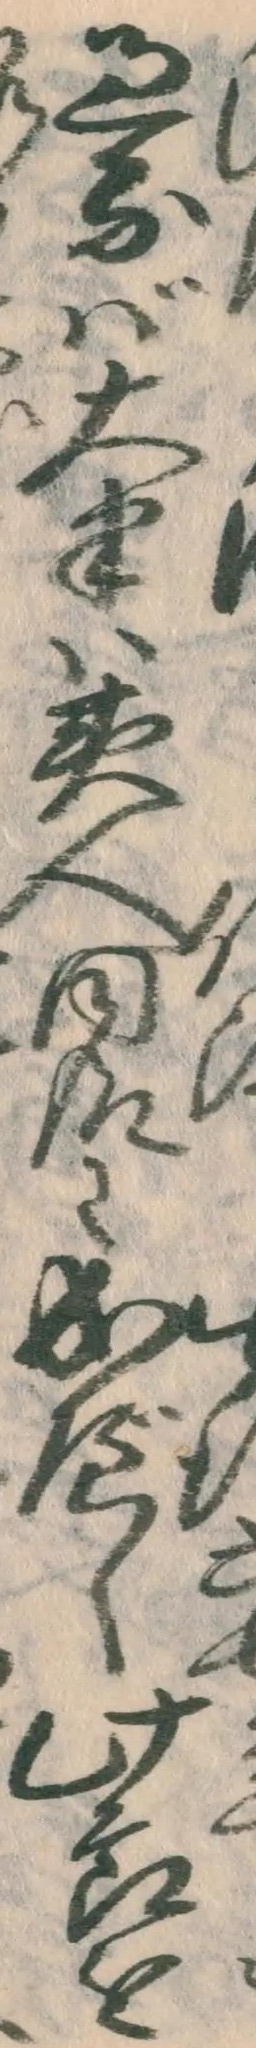過なバ大半ハ夷人同様に成べし此節を
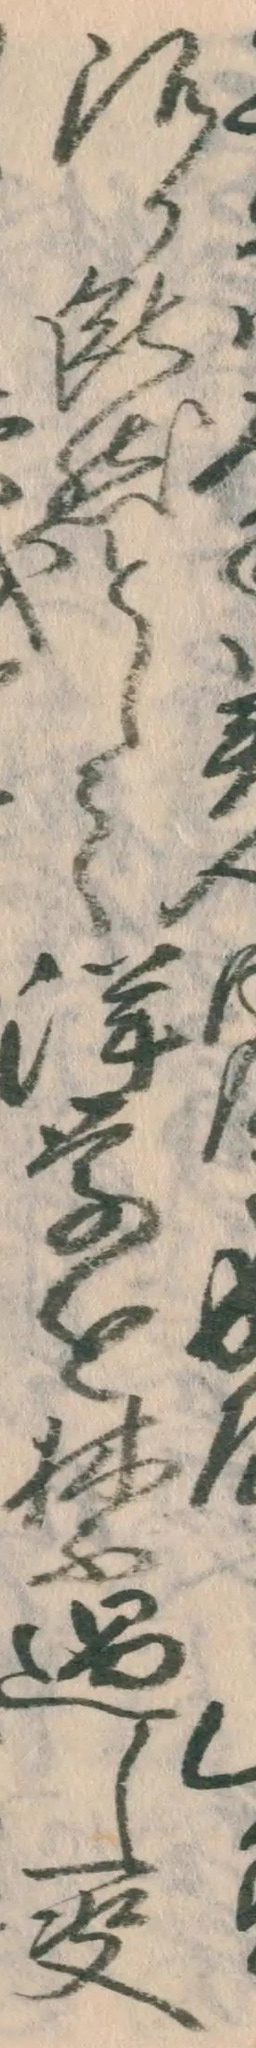限り断然として洋学を禁遇し一決
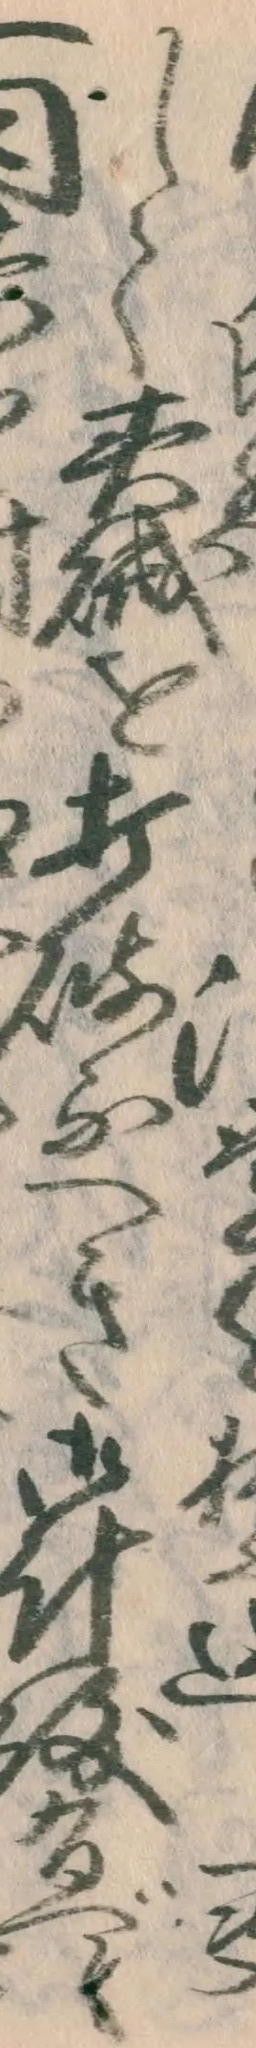して夷賊を打破るへき御計議有べし
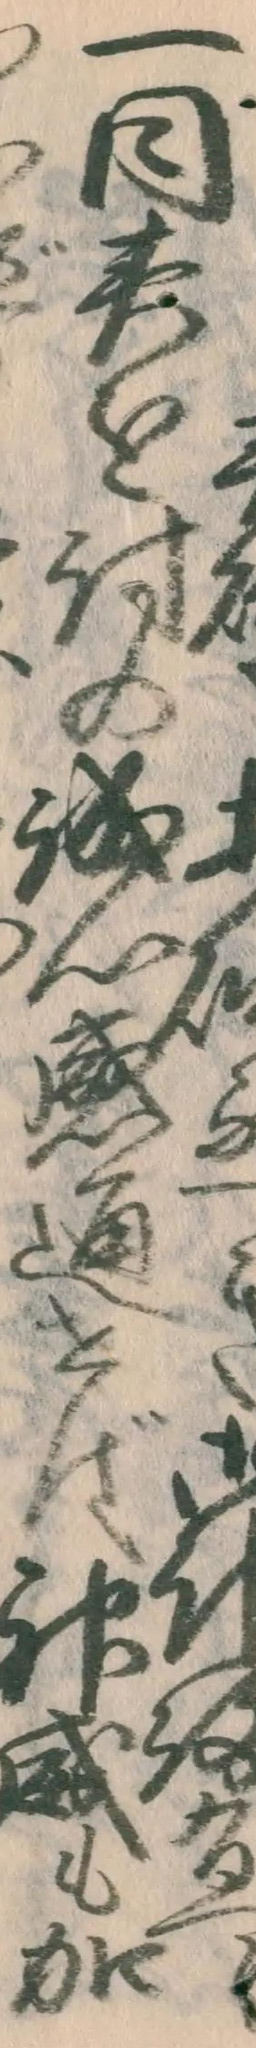一同夷を討の誠心感通せば神威も加
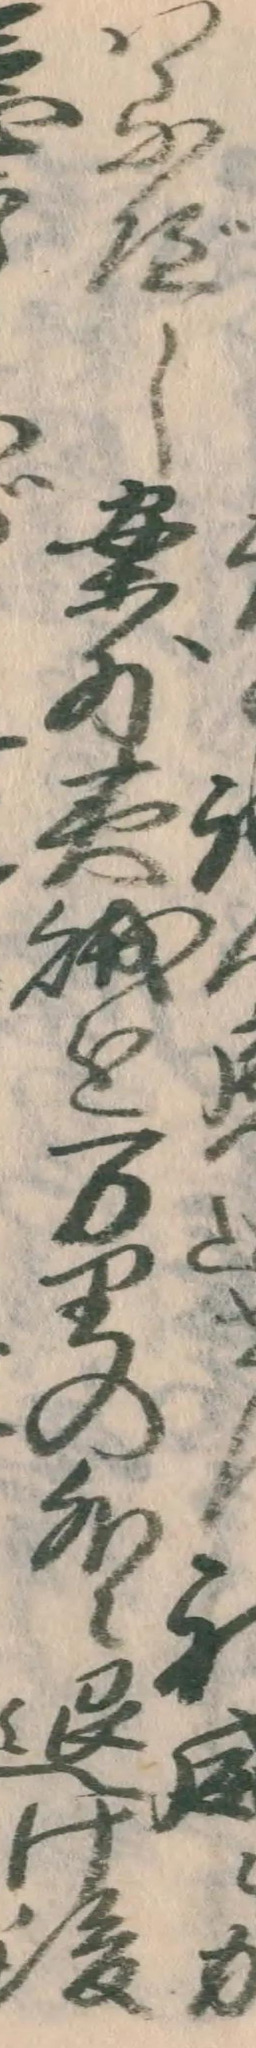ハるべし案外夷賊を万里の外ニ退け後
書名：麗斎叢書. 20
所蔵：国立国会図書館 National Diet Library, JAPAN
